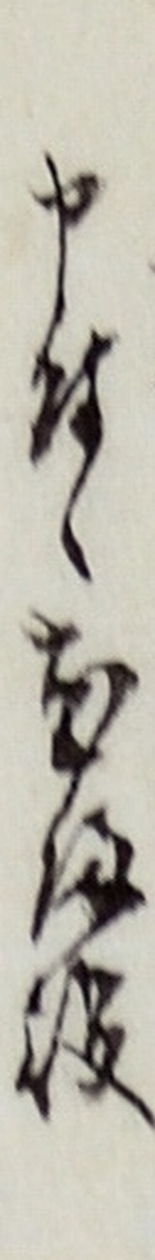申付候尤帰役
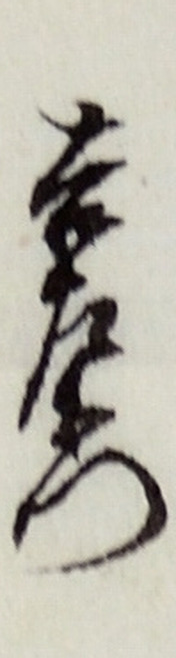吉左衛門
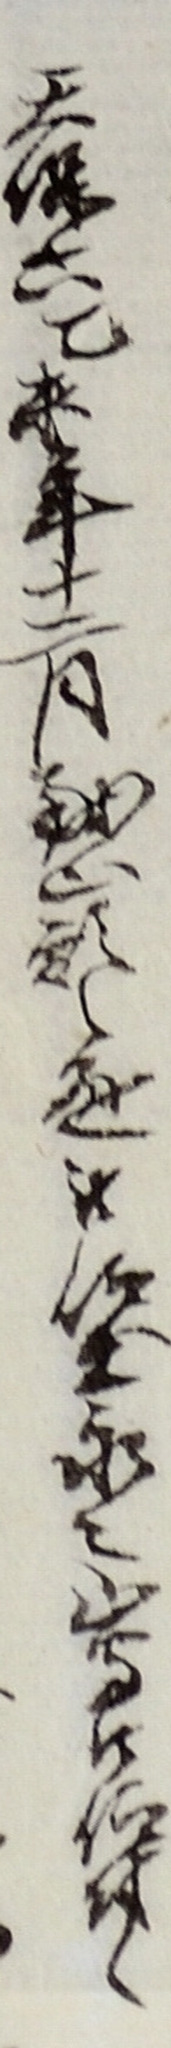天保六乙未年十二月献山願之通被仰出永々山守被仰付候
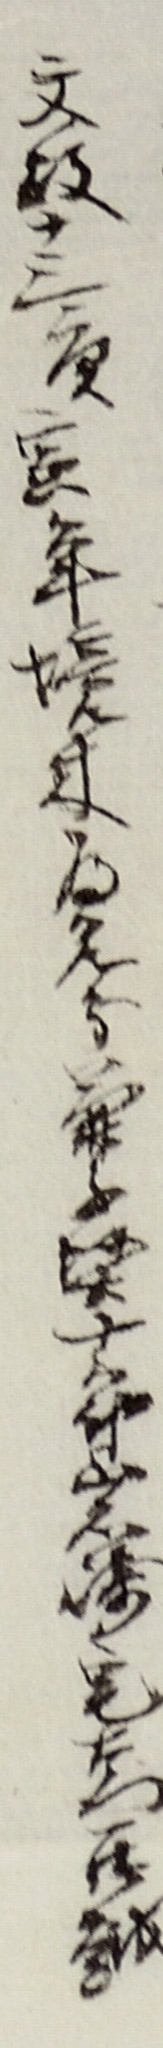文政十三庚寅年境木為見分兼子堅十郎岩崎宅右衛門罷越
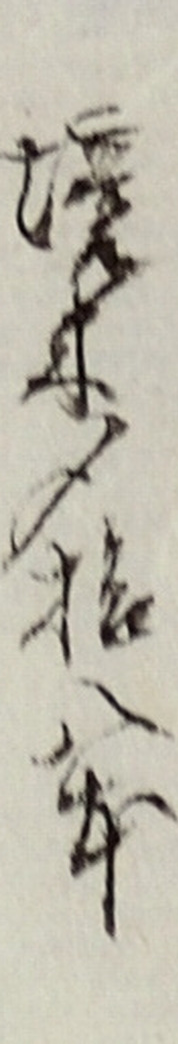境木〆拾八本
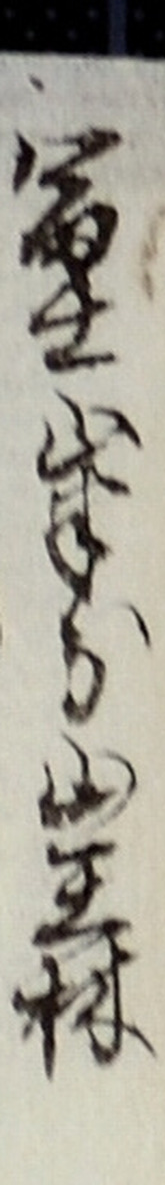富士山半分山王林
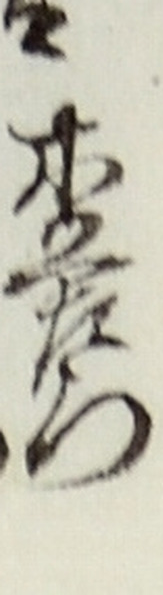吉左衛門
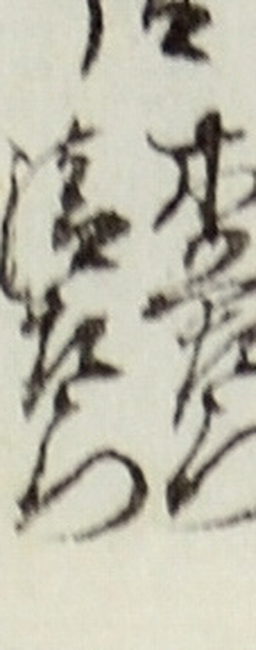清左衛門
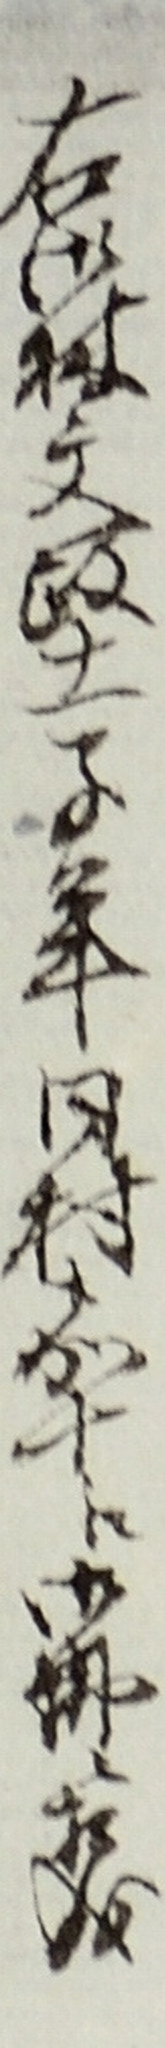右御林文政十一子年同村嘉十え御払ニ相成
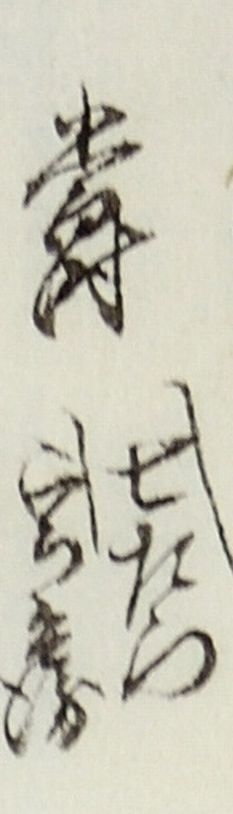宇兵衛
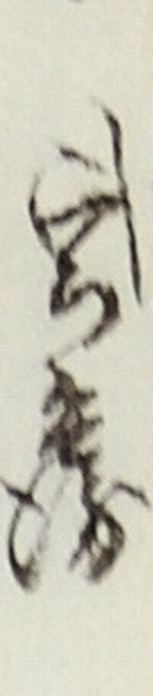宇兵衛
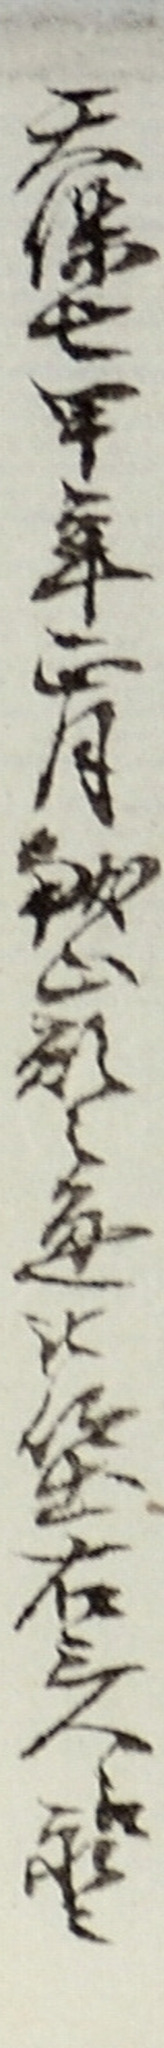天保七申年正月越山願之通被仰出右三人え永々
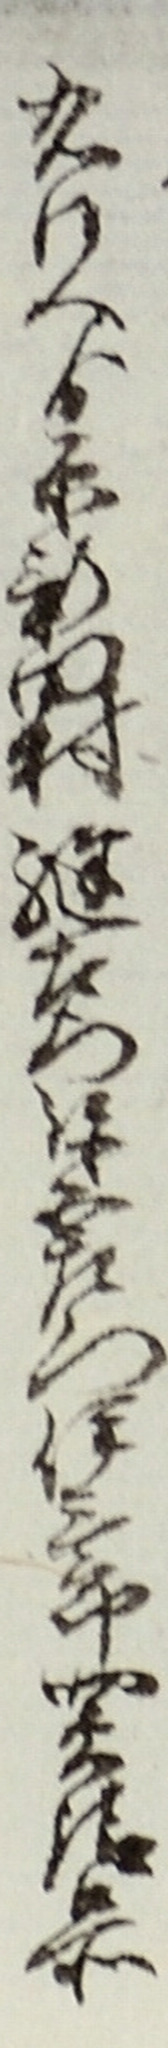右同人ゟ原新田村縫左衛門弥五左衛門伊三郎四兵治え所
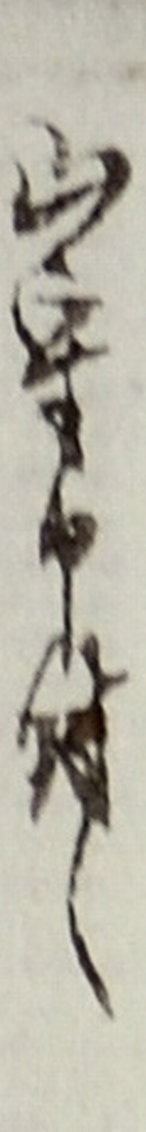山守申付候
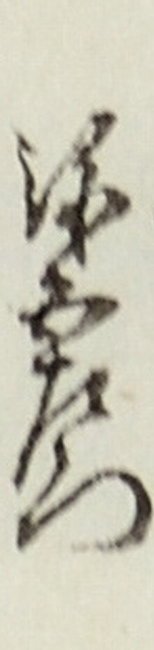弥五左衛門
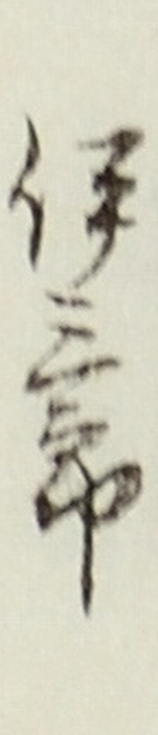伊三郎
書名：山林帳草稿
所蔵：伊那市立高遠町図書館・合同会社AMANE
